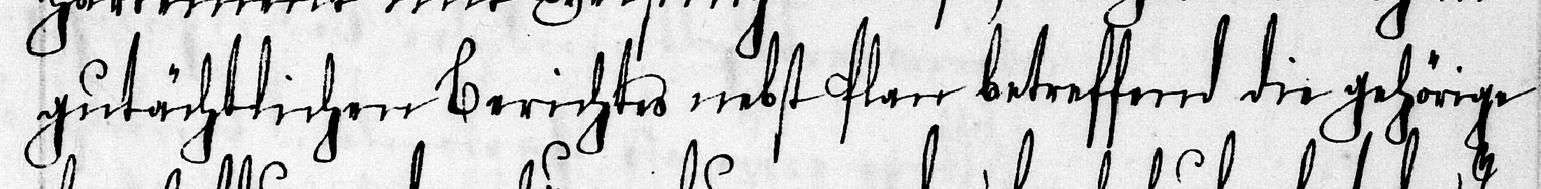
gutächtlichen Berichtes nebst Plan betreffend die gehörige
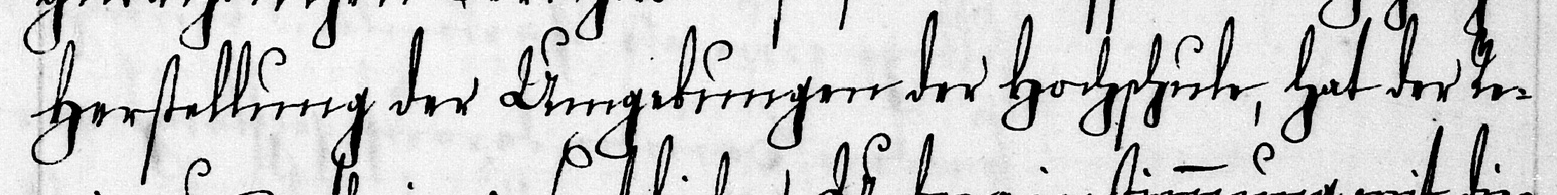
Herstellung der Umgebungen der Hochschule, hat der Re¬
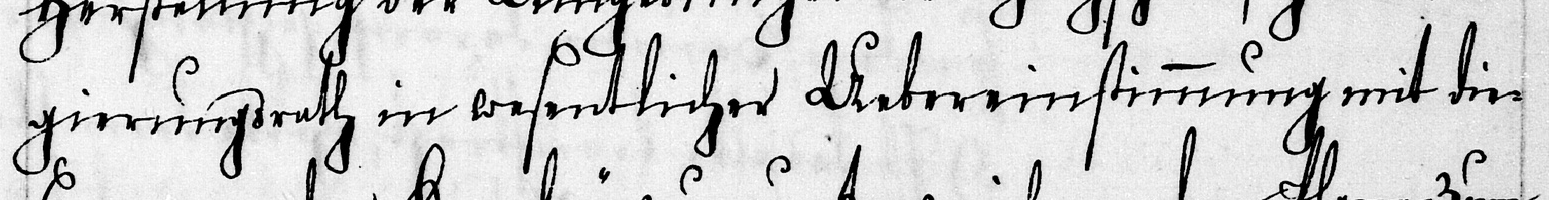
gierungsrath in wesentlicher Uebereinstimmung mit die¬
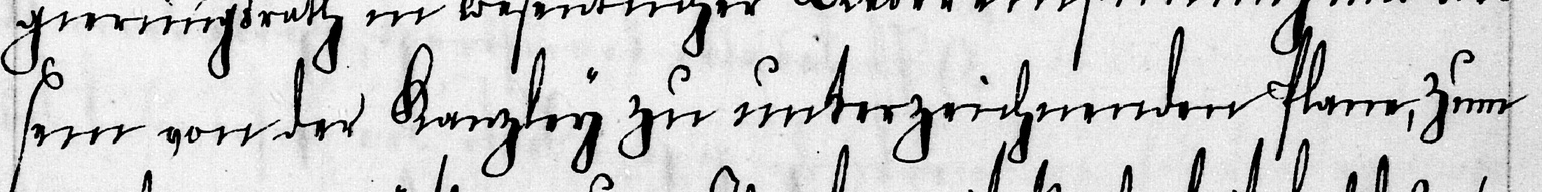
sem von der Kanzley zu unterzeichnenden Plane, zum
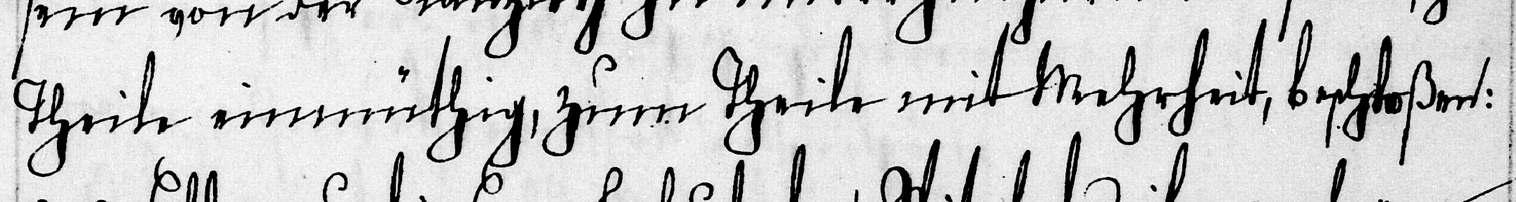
Theile einmüthig, zum Theile mit Mehrheit, beschloßen:
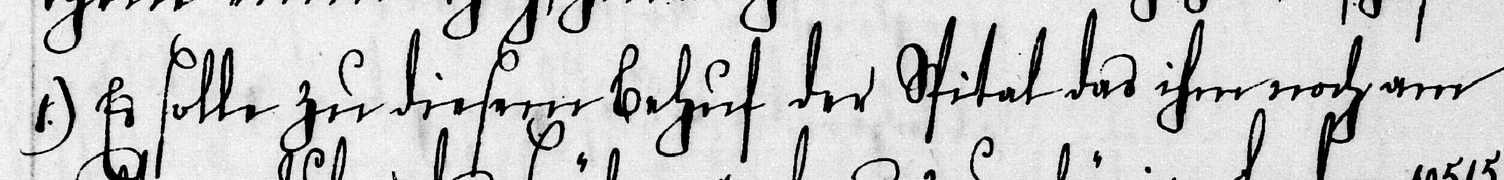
1.) Es solle zu diesem Behuf der Spital das ihm noch am
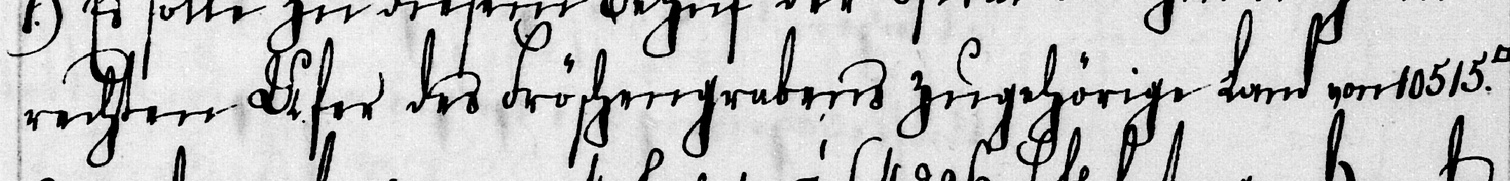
rechten Ufer des Fröschengrabens zugehörige Land von 10515.
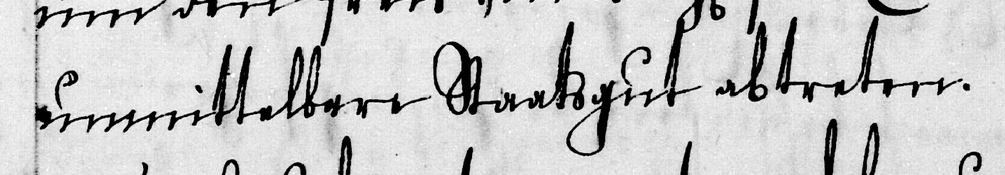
unmittelbare Staatsgut abtreten.
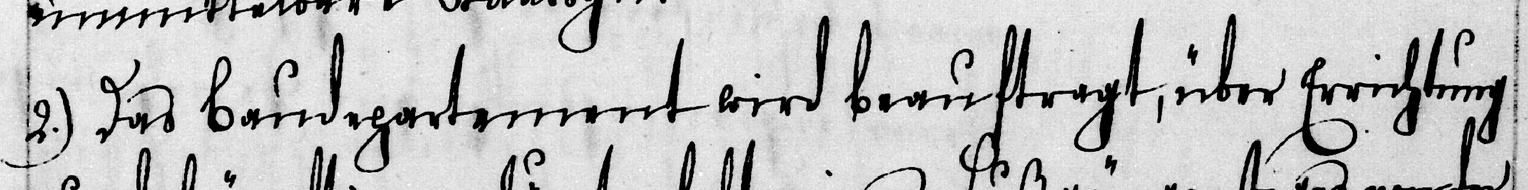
2.) Das Baudepartement wird beauftragt, über Errichtung
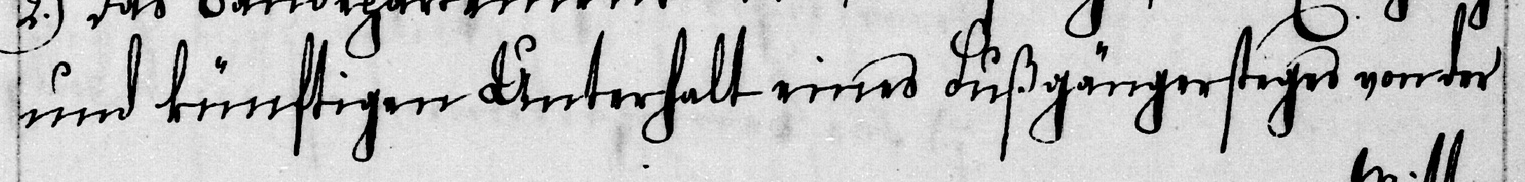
und künftigen Unterhalt eines Fußgängersteges von der
